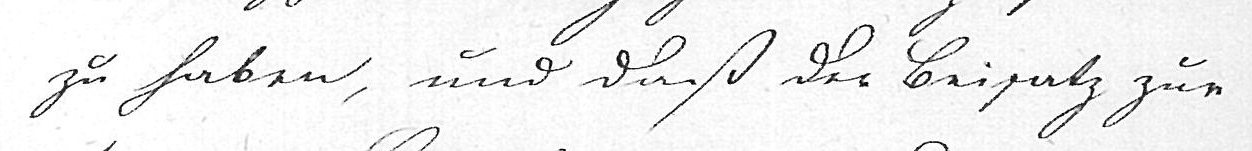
zu haben, und daß der Beisatz zur
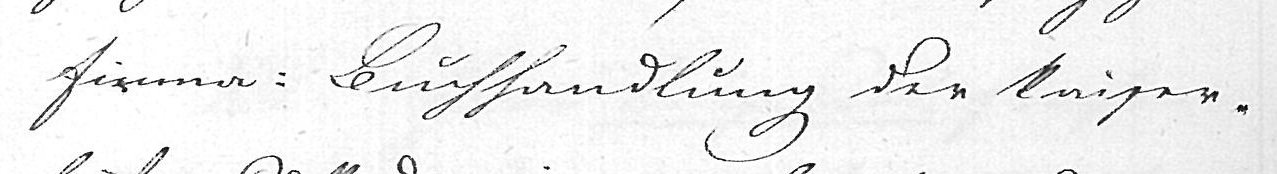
Firma: Buchhandlung der kaiser-
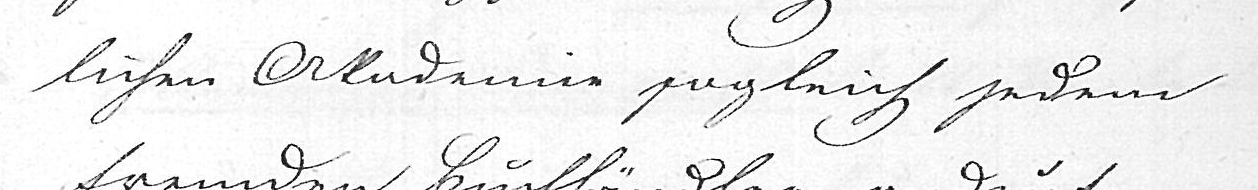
lichen Akademie sogleich jedem
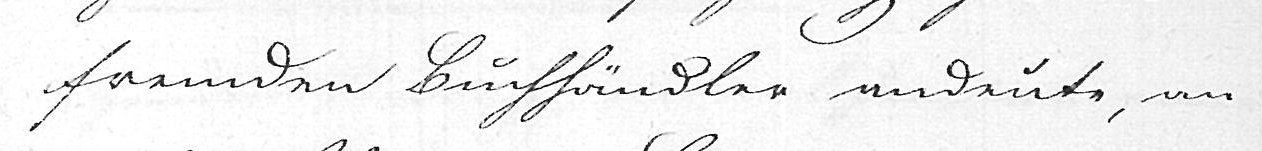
fremden Buchhändler andeute, an
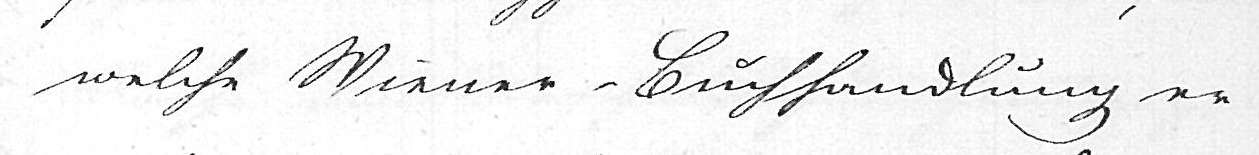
welche Wiener Buchhandlung er
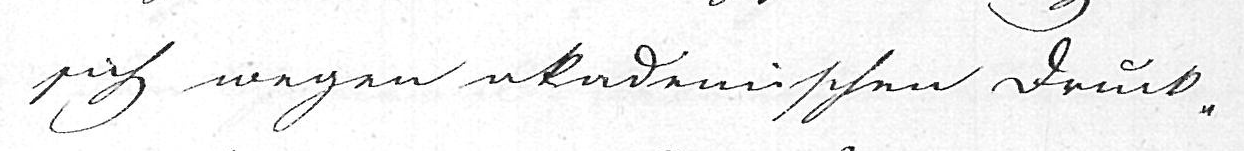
sich wegen akademischen Druck-
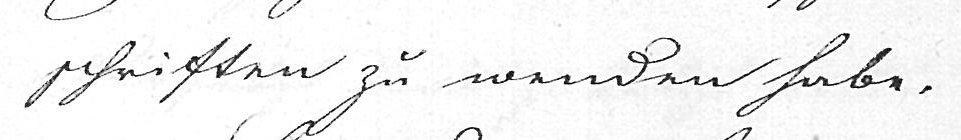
schriften zu wenden habe.
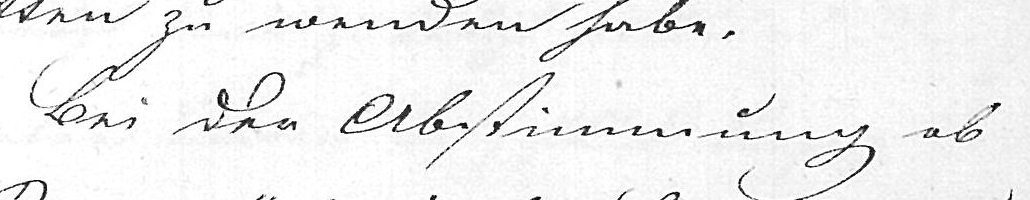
Bei der Abstimmung ob
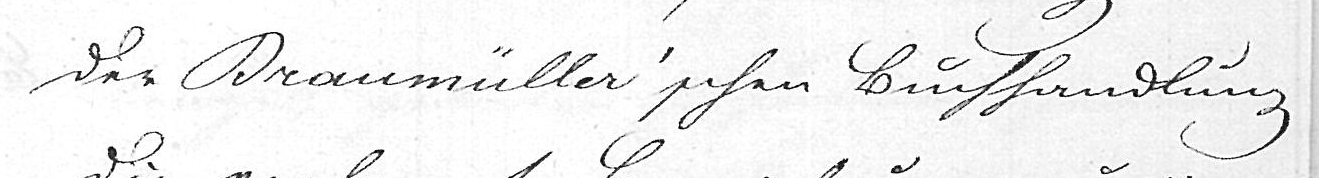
der Braumüller'schen Buchhandlung
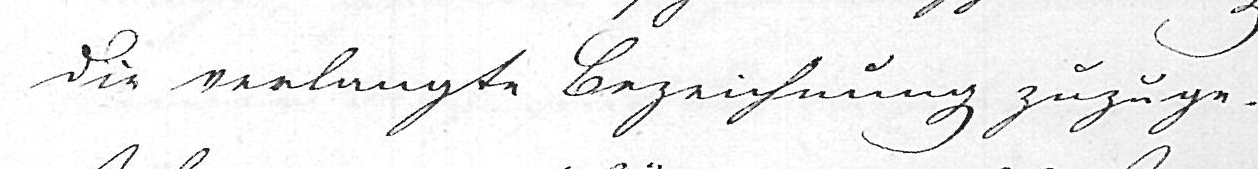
die verlangte Bezeichnung zuzuge-
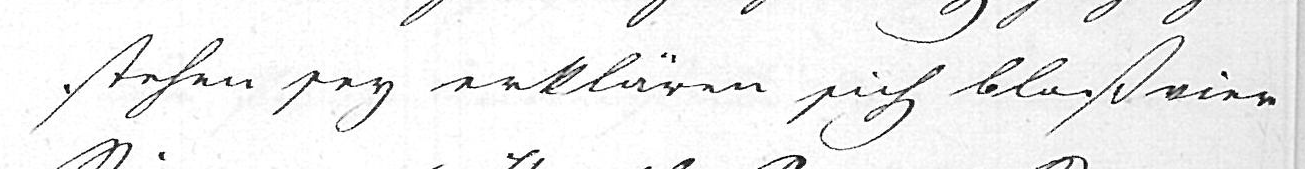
stehen sey erklären sich bloß vier
